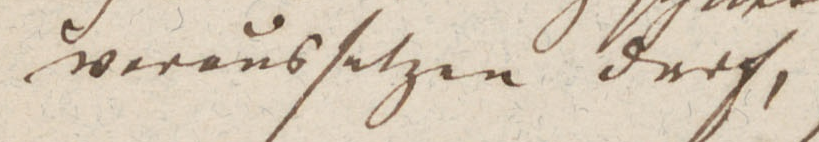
voraussetzen darf,)
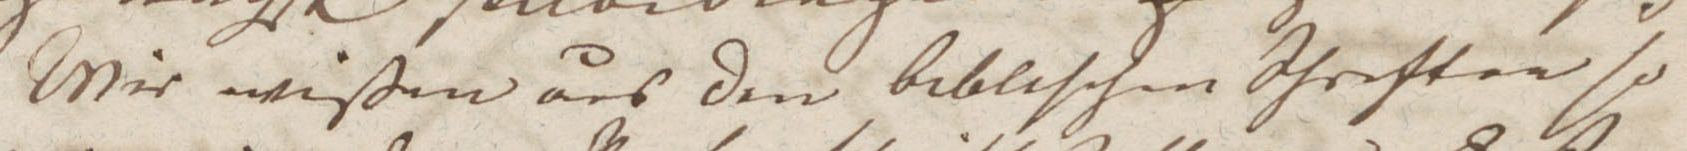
Wir wissen aus den biblischen Schriften so
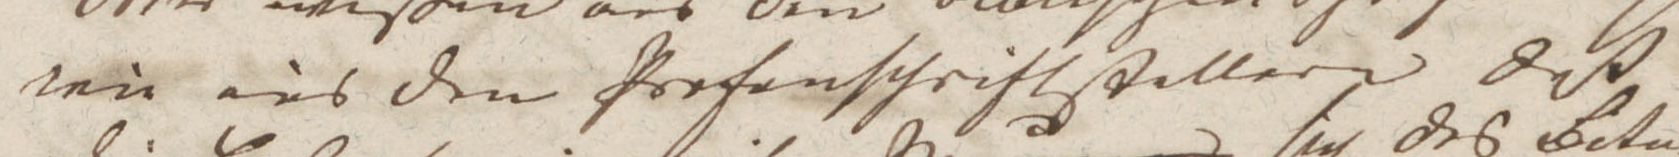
wie aus den Profanschriftstellern dass
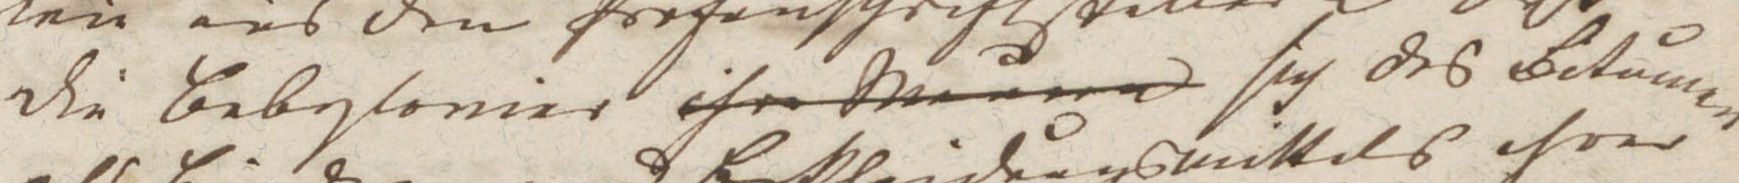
die Babylonier ihre Mauern sich des Bitumen
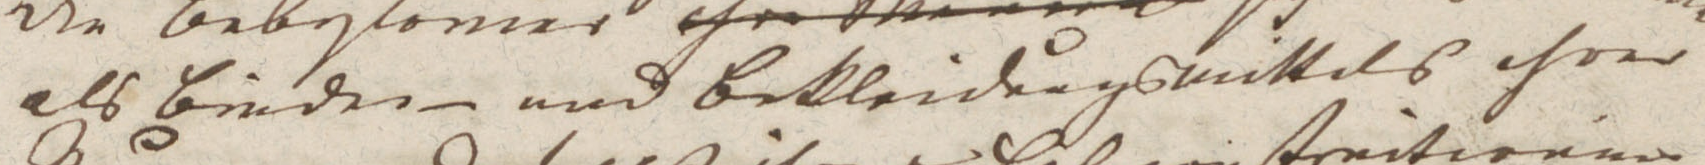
als Binde- und Bekleidungsmittels ihrer
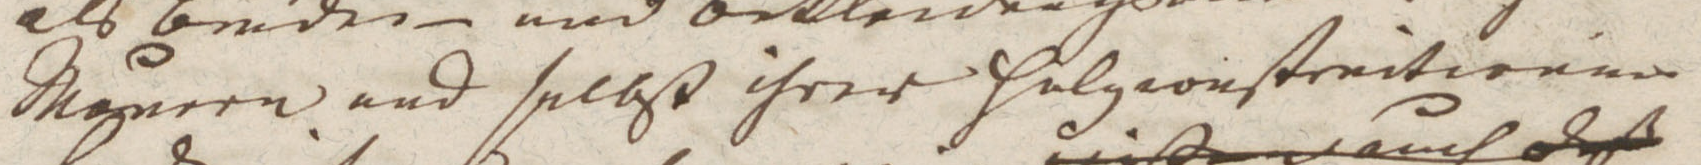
Mauern und selbst ihrer Holzconstructionen
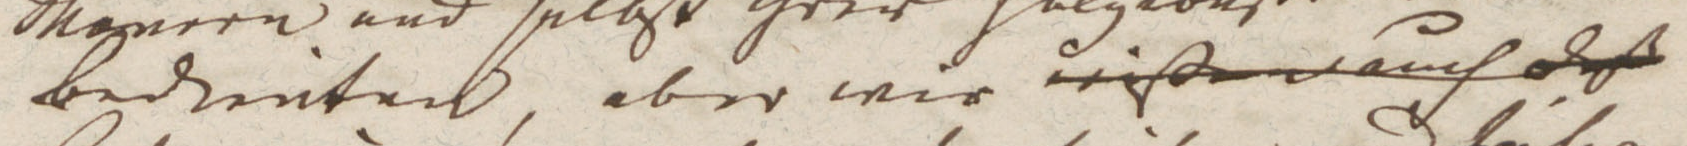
bedienten, aber wir wissen auch dass
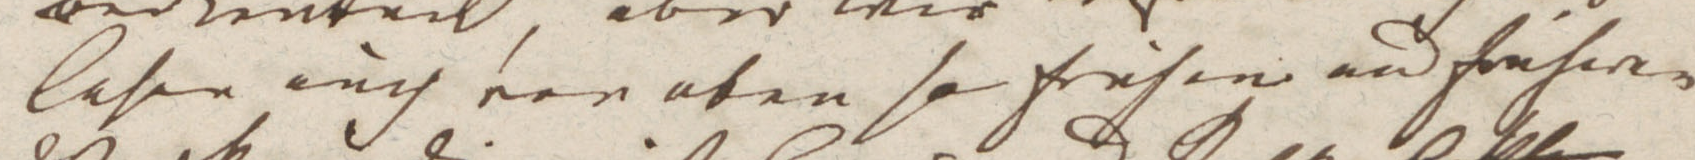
lesen auch von eben so frühen und früheren
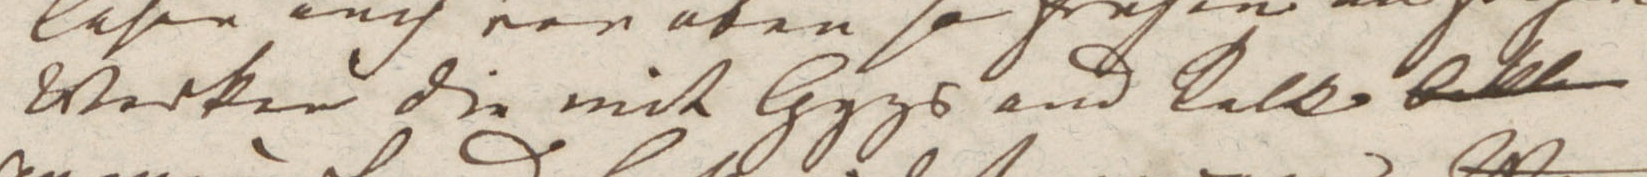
Werken die mit Gyps und Kalk bekl
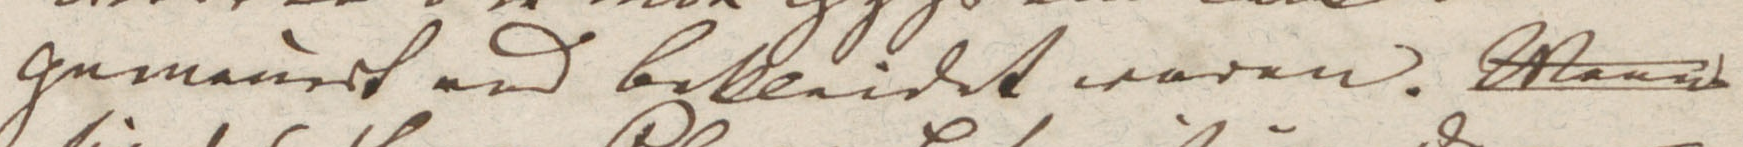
gemauert und bekleidet waren. Wenn
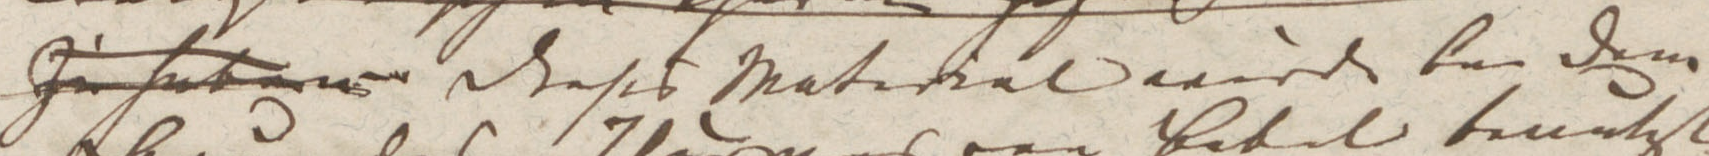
zu haben Dieses Material wurde bei dem
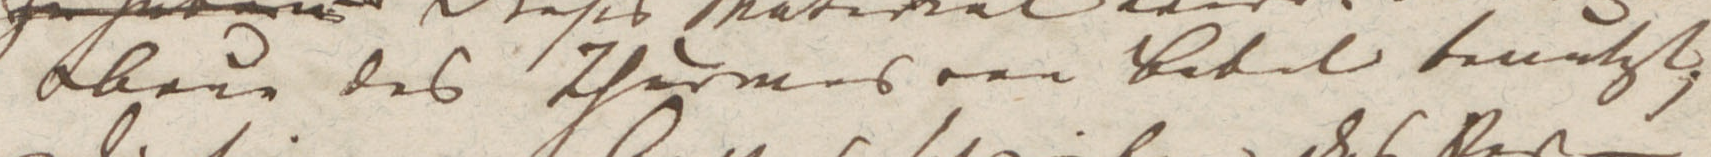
Baue des Thurmes von Babel benutzt
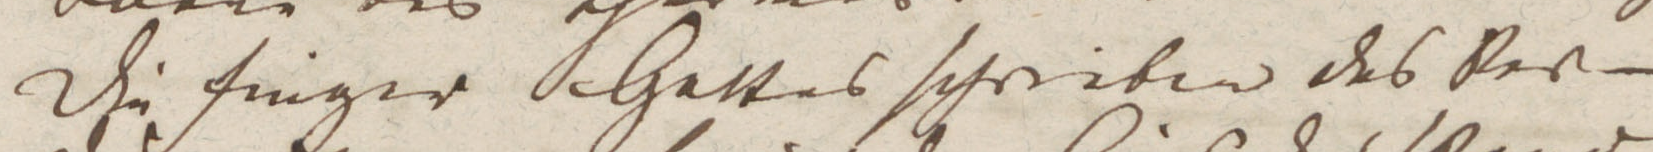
Die Finger Gottes schrieben das Ver-
